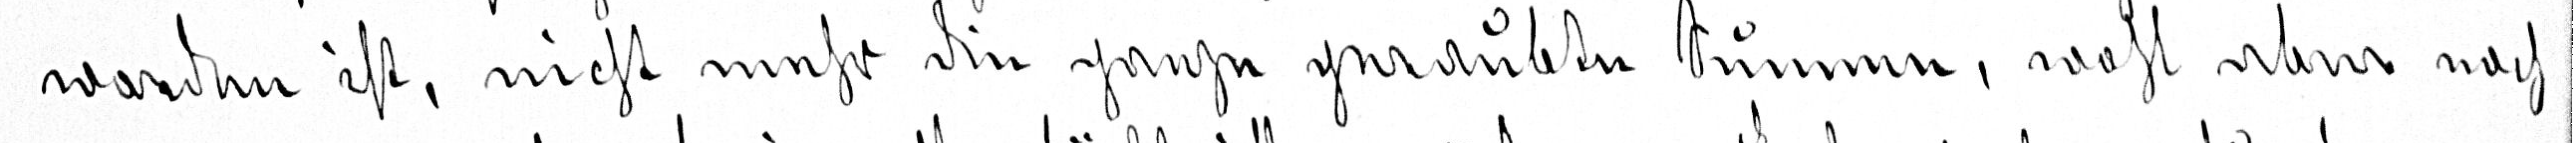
worden ist, nicht mehr die ganze geraubte Summe, wohl aber noch
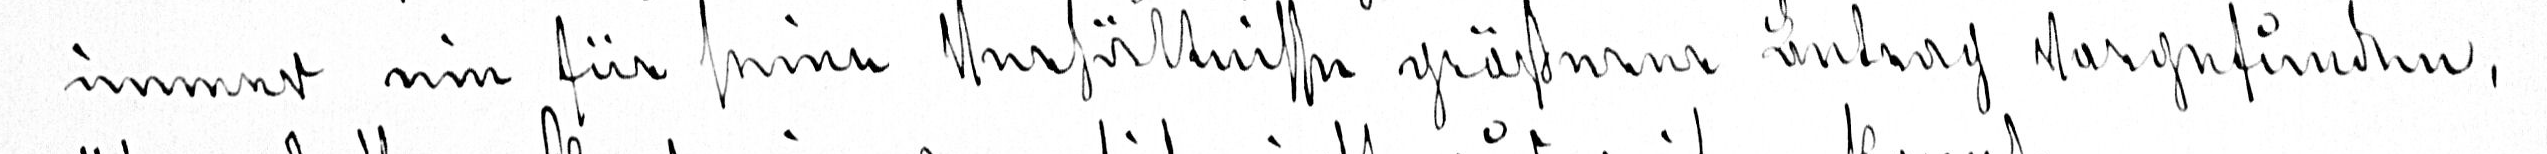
immer ein für seine Verhältnisse größerer Betrag vorgefunden,
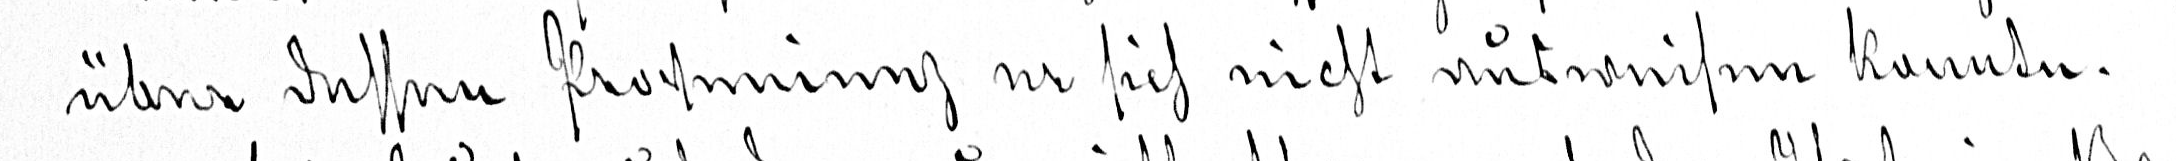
über dessen Provenienz er sich nicht ausweisen konnte.
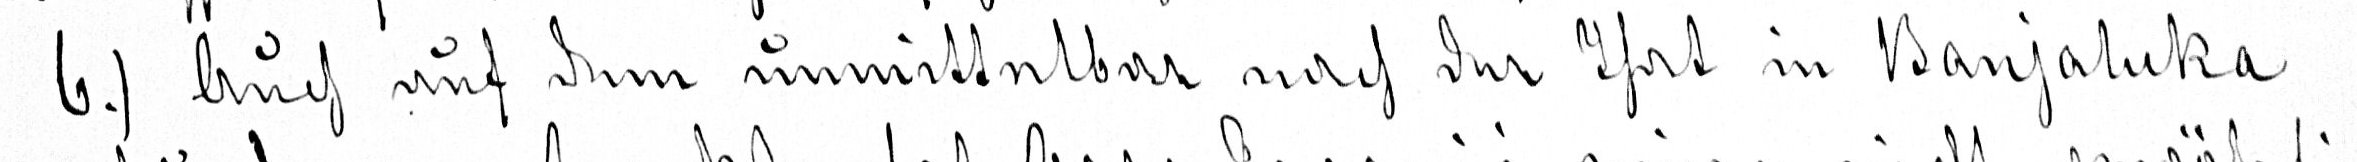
6.) Auch auf dem unmittelbar nach der That in Banjaluka
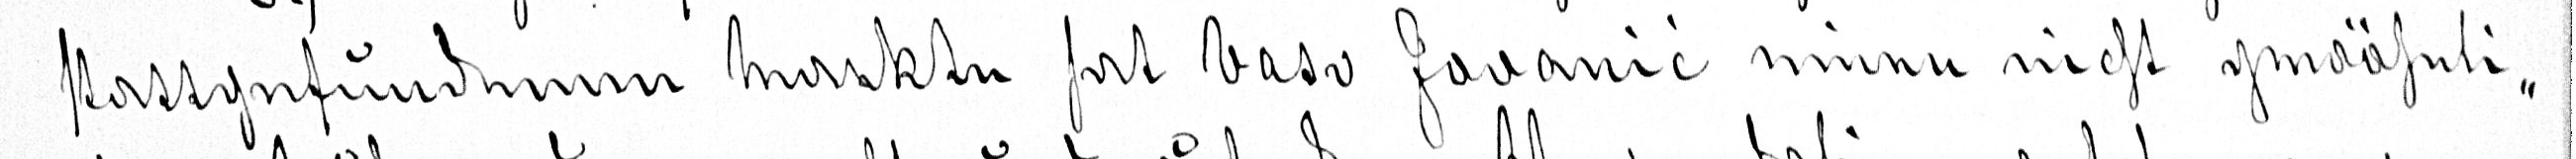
stattgefundenen Markte hat Vaso Jovanić einen nicht gewöhnli¬
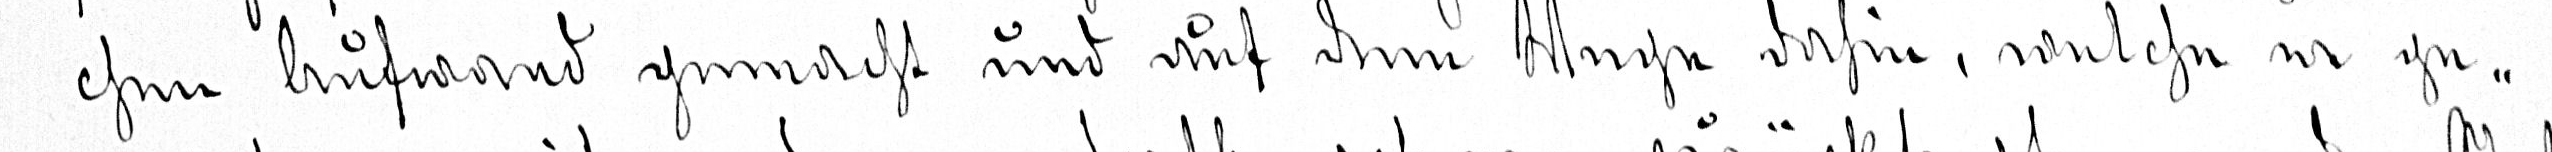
chen Aufwand gemacht und auf dem Wege dahin, welche er ge¬
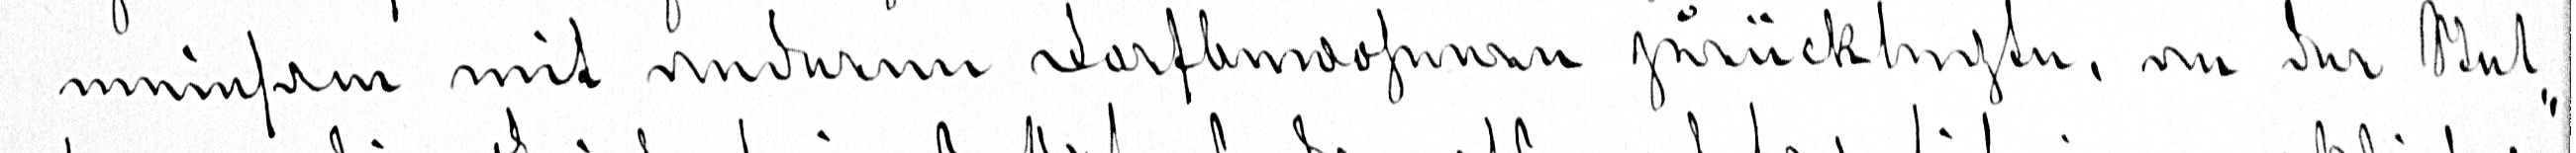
meinsam mit anderen Dorfbewohnern zurücklegte, an der Stel¬
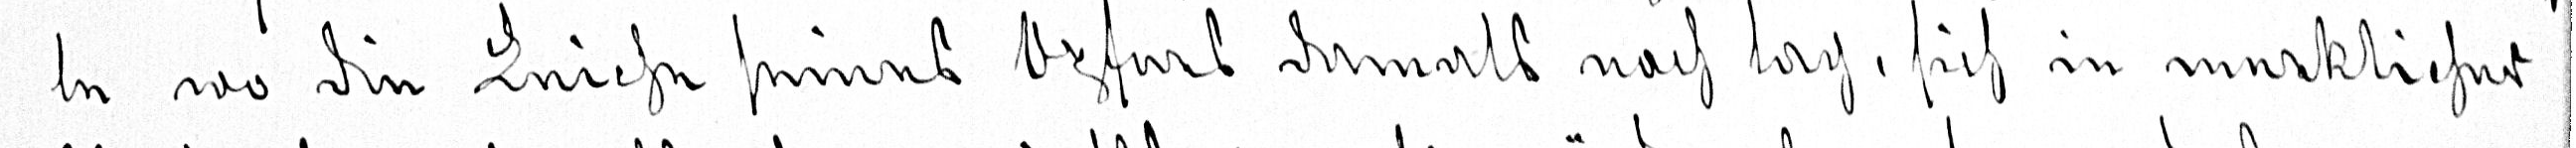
le wo die Leiche seines Opfers damals noch lag, sich in merklicher
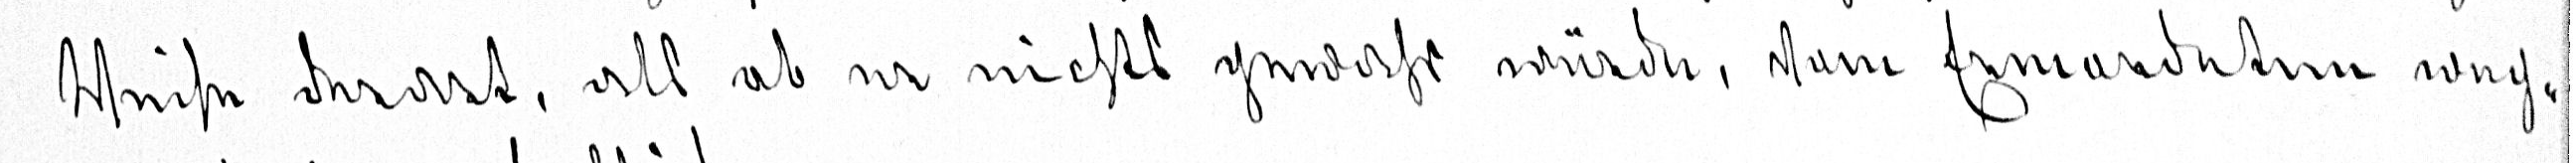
Weise derart, als aob er nichts gewahr würde, vom Ermordeten weg¬
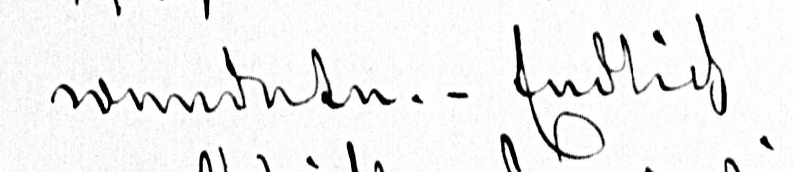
wendete.- Endlich
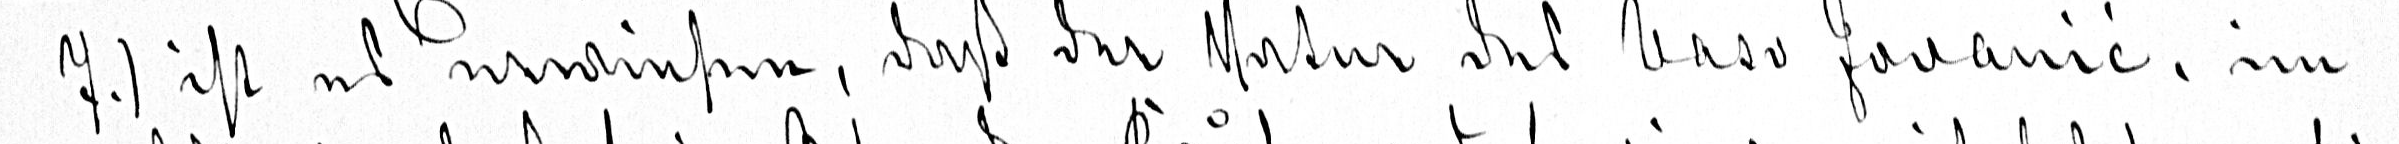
7.) ist es erwiesen, daß der Vater des Vaso Jovanić, im
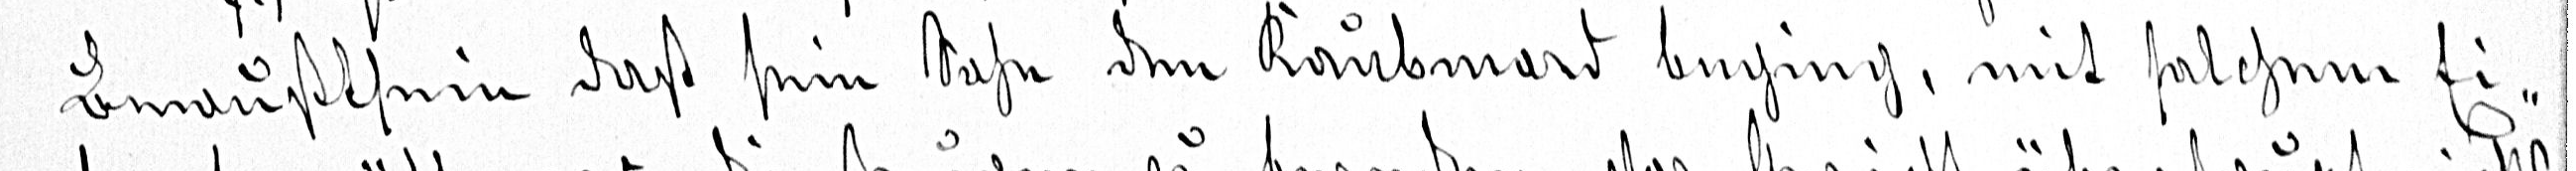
Bewußtsein daß sein Sohn den Raubmord beging, mit solchem Ei¬
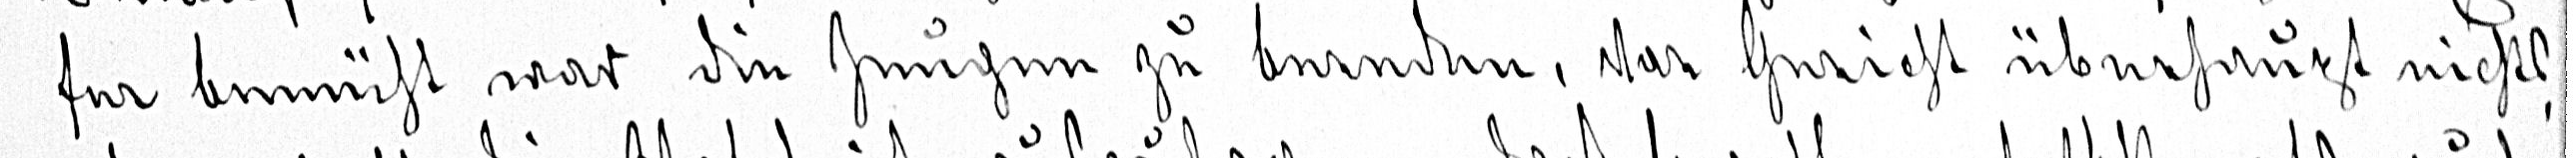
fer bemüht war die Zeugen zu bereden, vor Gericht überhaupt nichts,
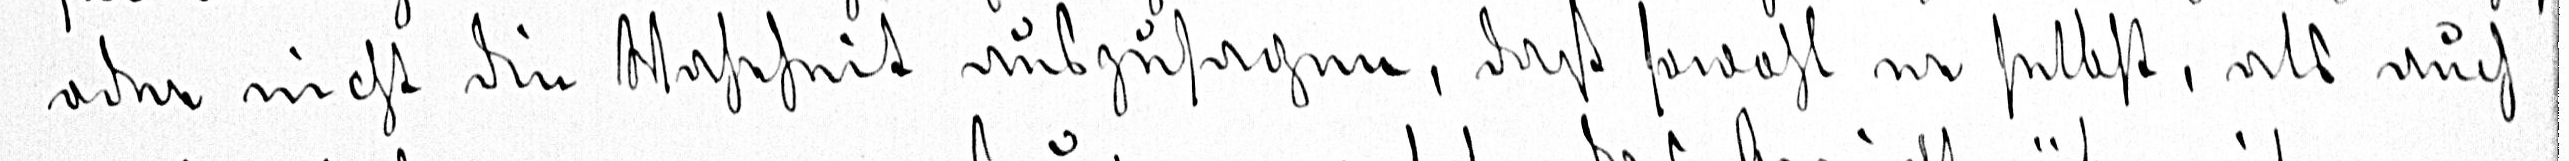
oder nicht die Wahrheit auszusagen, daß sowohl er selbst, als auch
